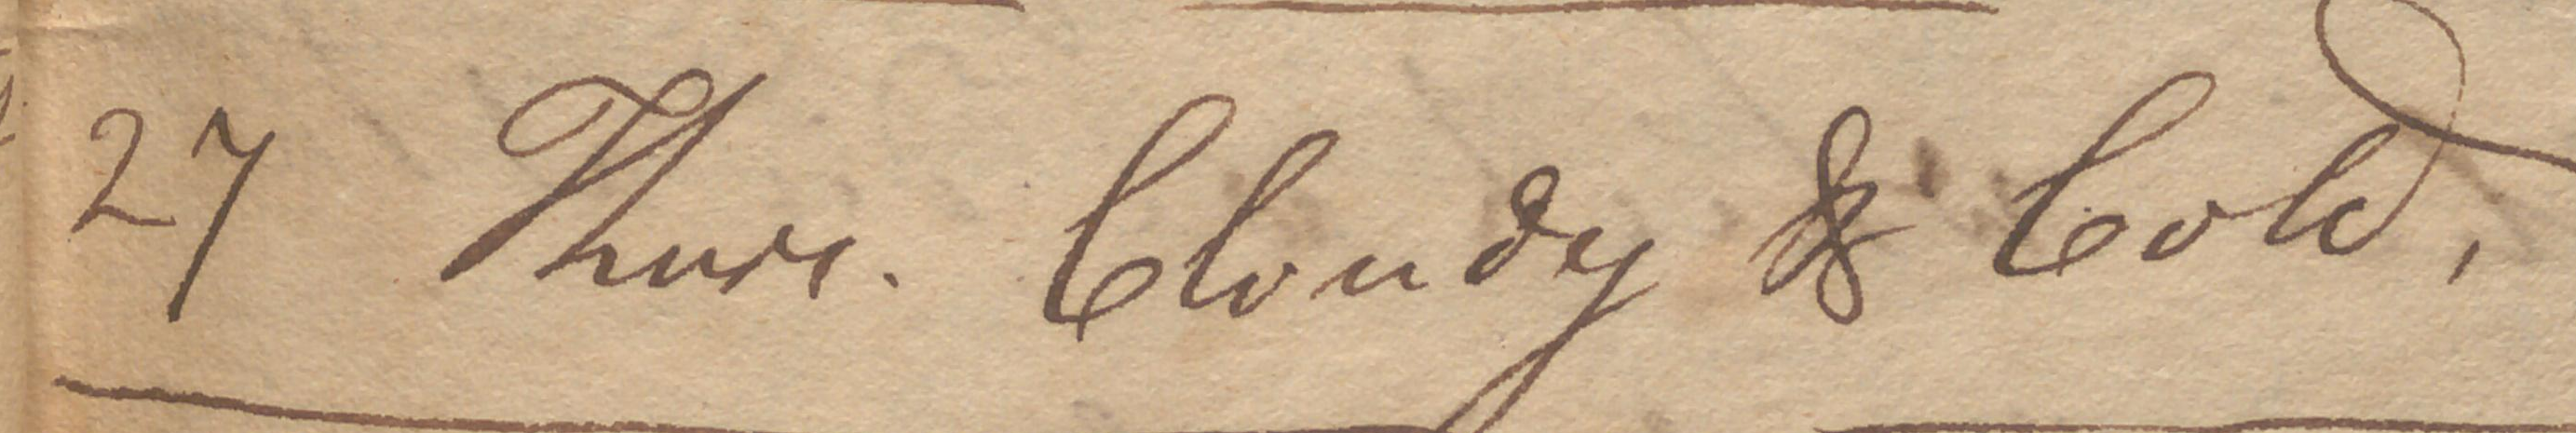27 Thurs. Cloudy & Cold,
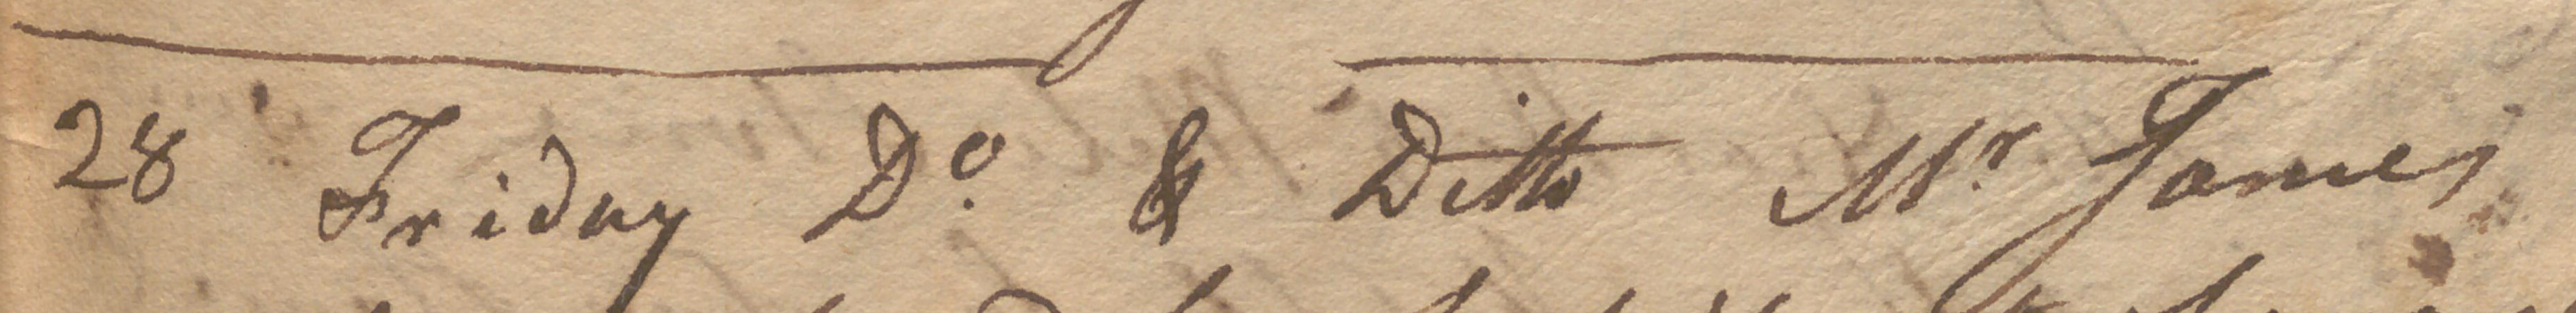28 Friday D^o. & Ditto M^r. James
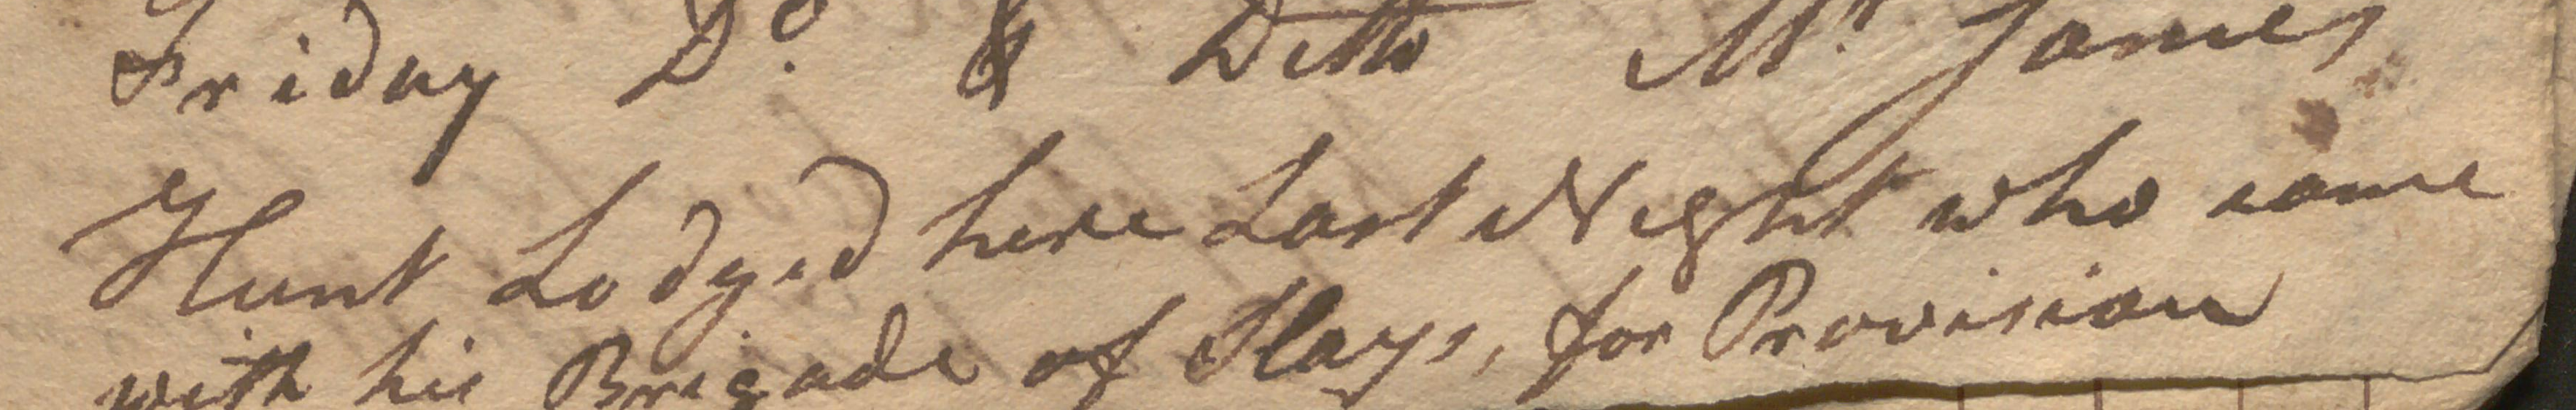Hunt Lodged here Last Night who came
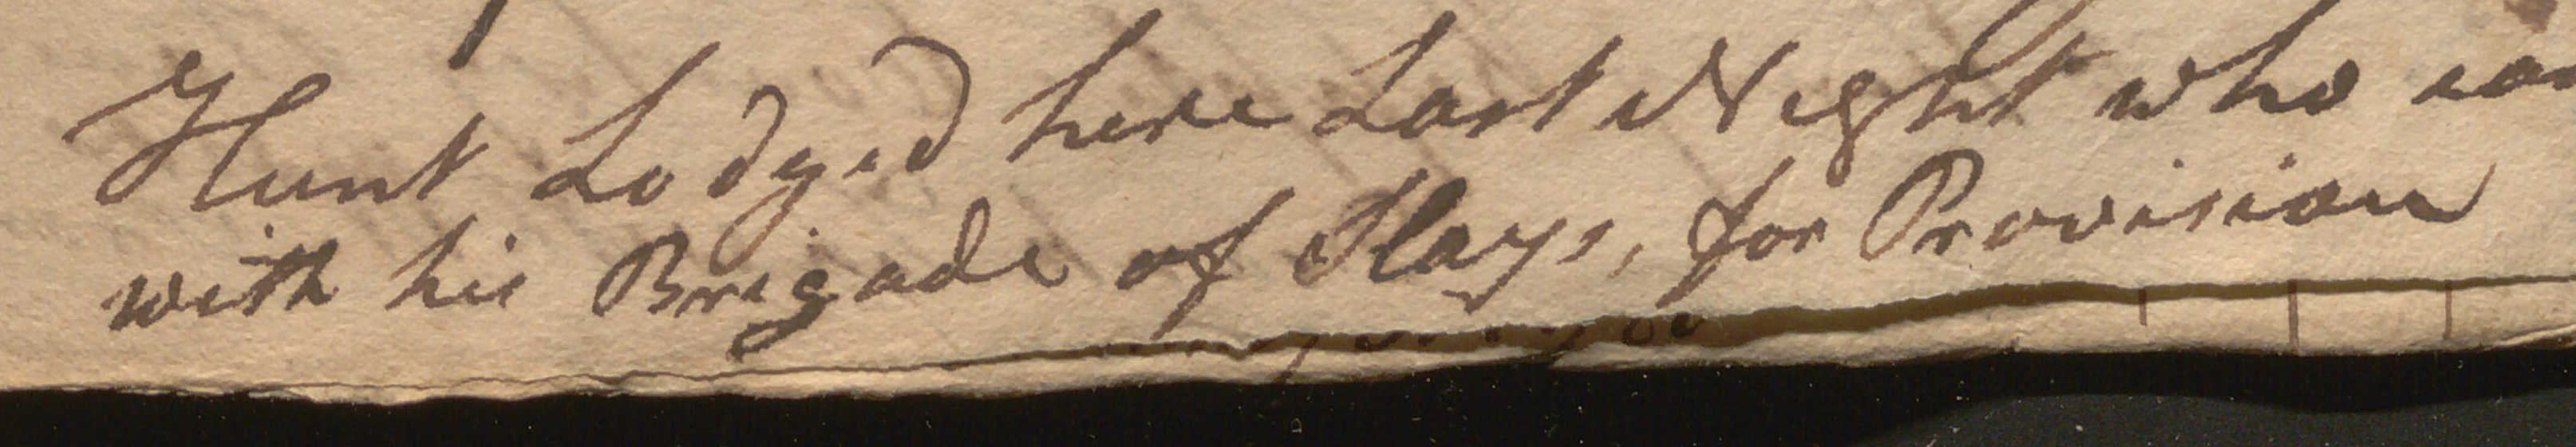with his Brigade of Slays, for Provision
